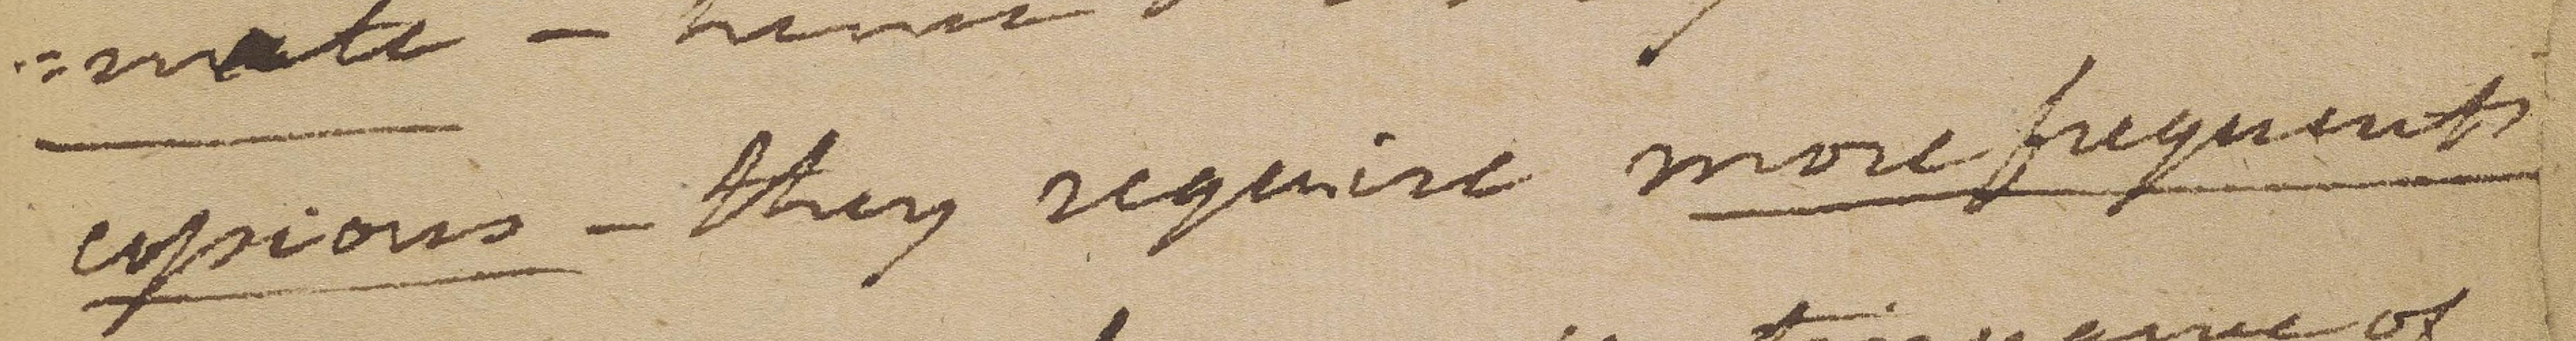copious- they require more frequent
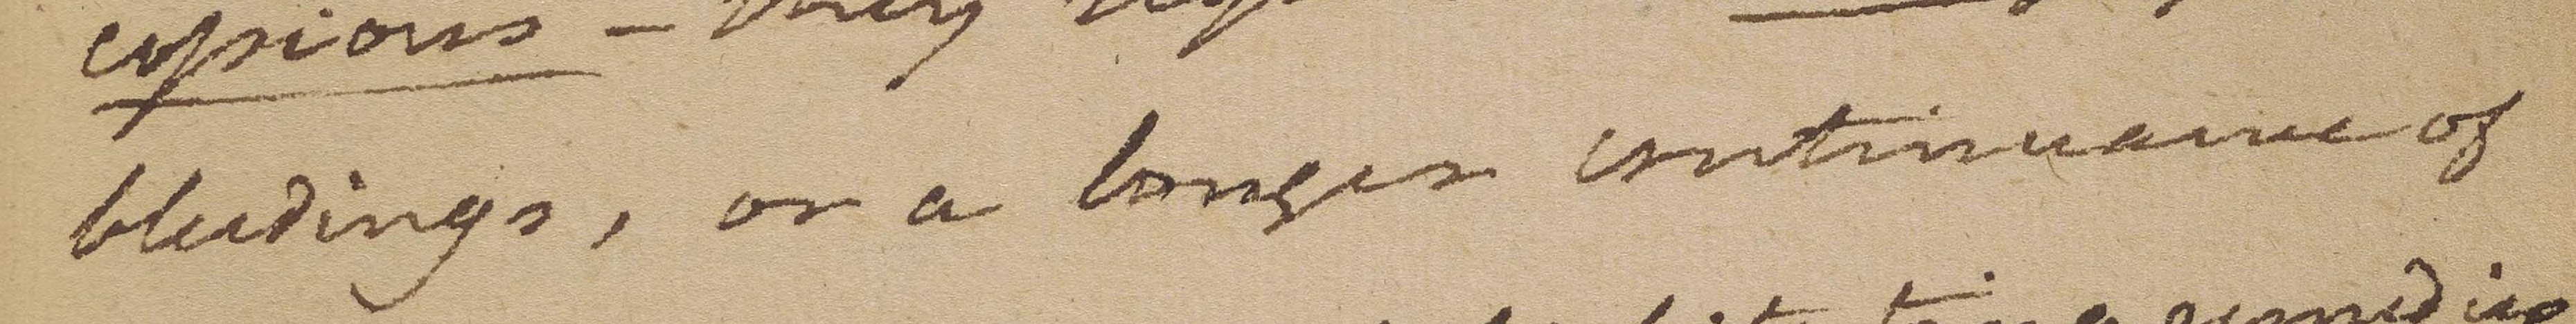bleedings, or a longer continuance of
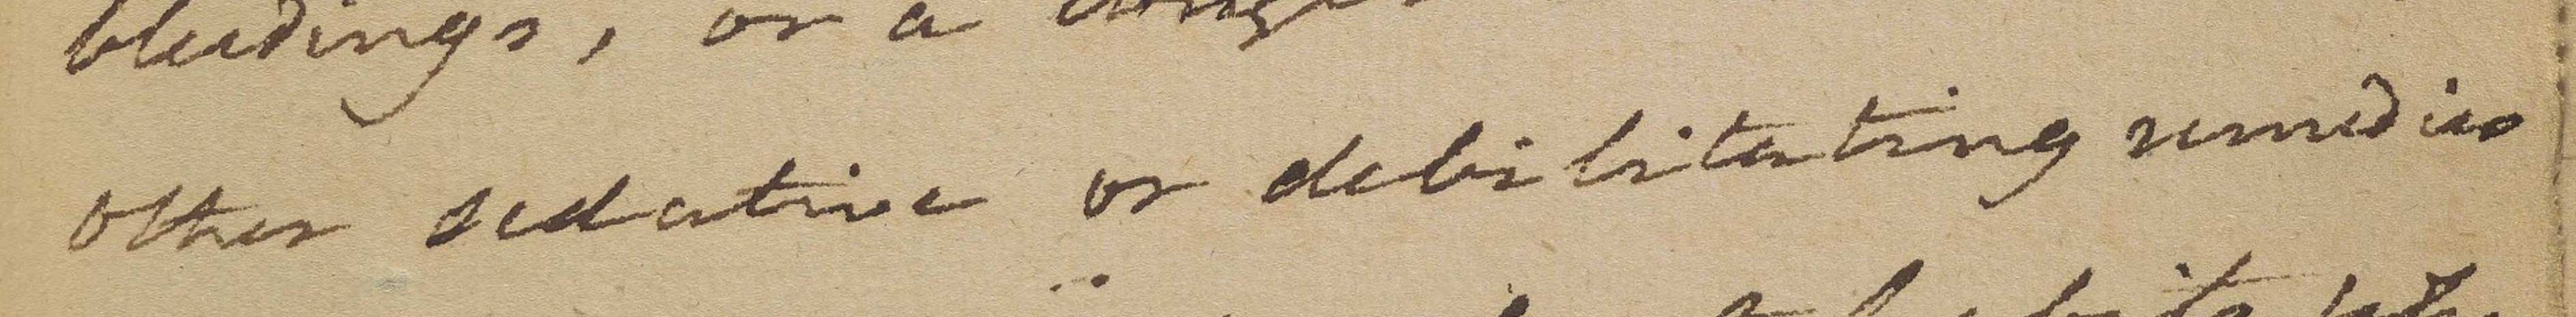other sedative or debilitating remedies
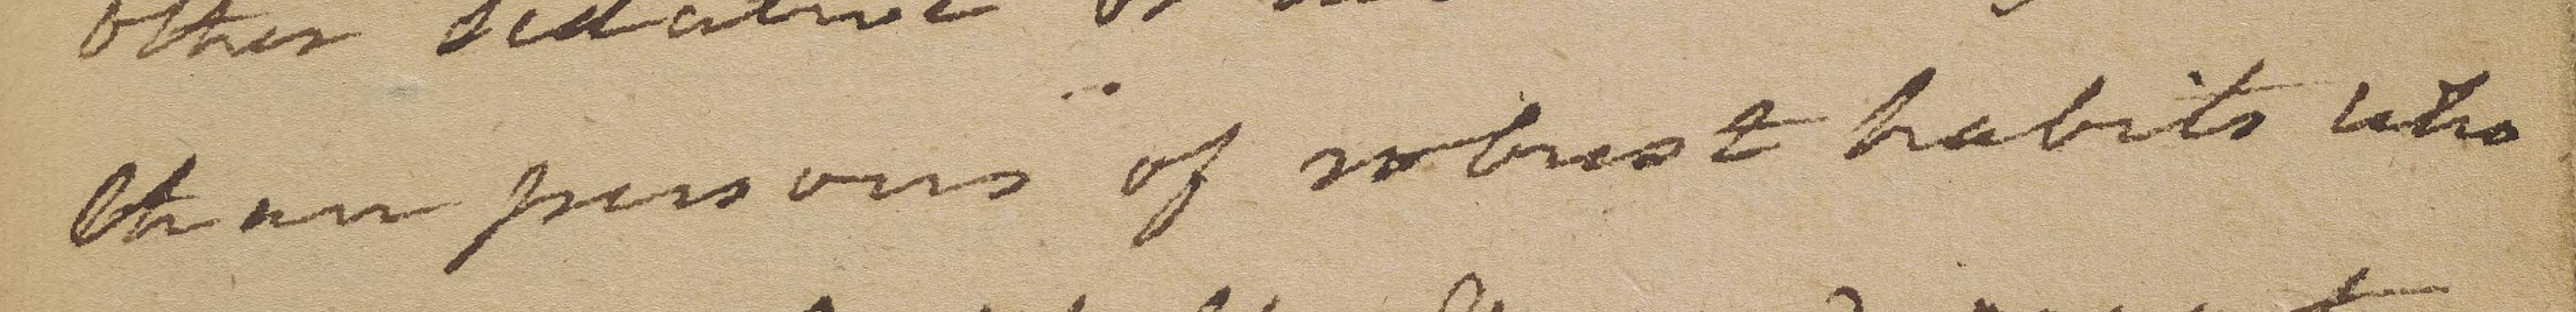than persons of robust habits who
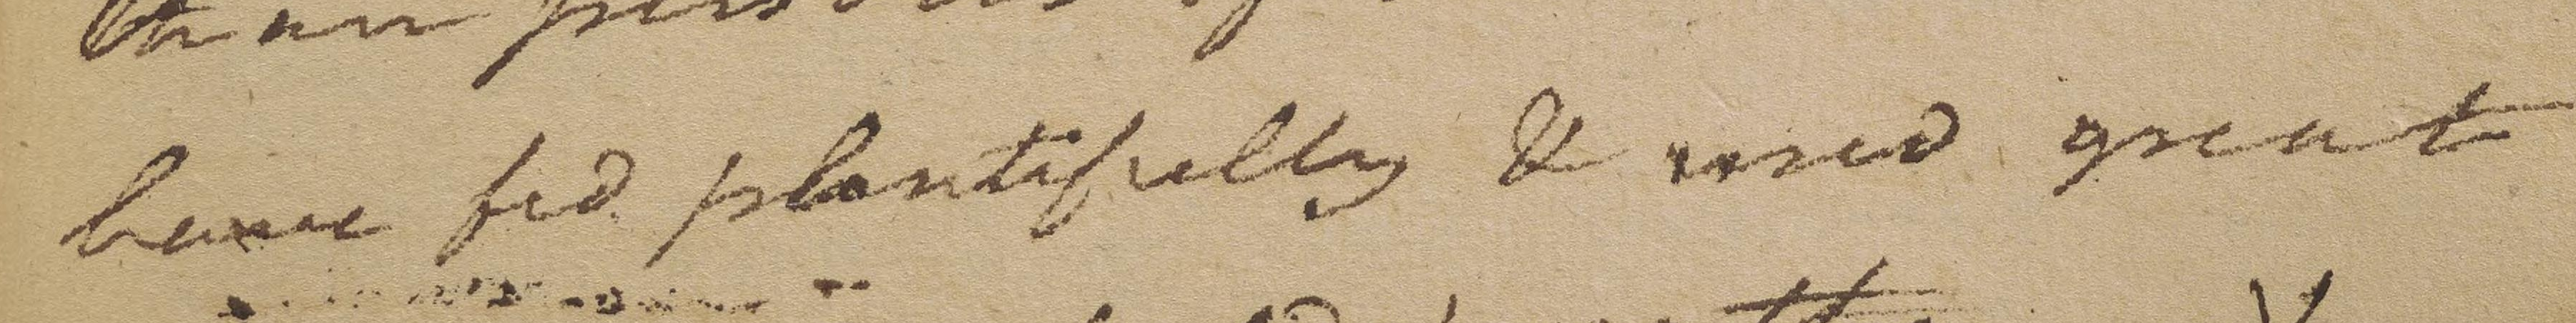have fed plentifully & need great
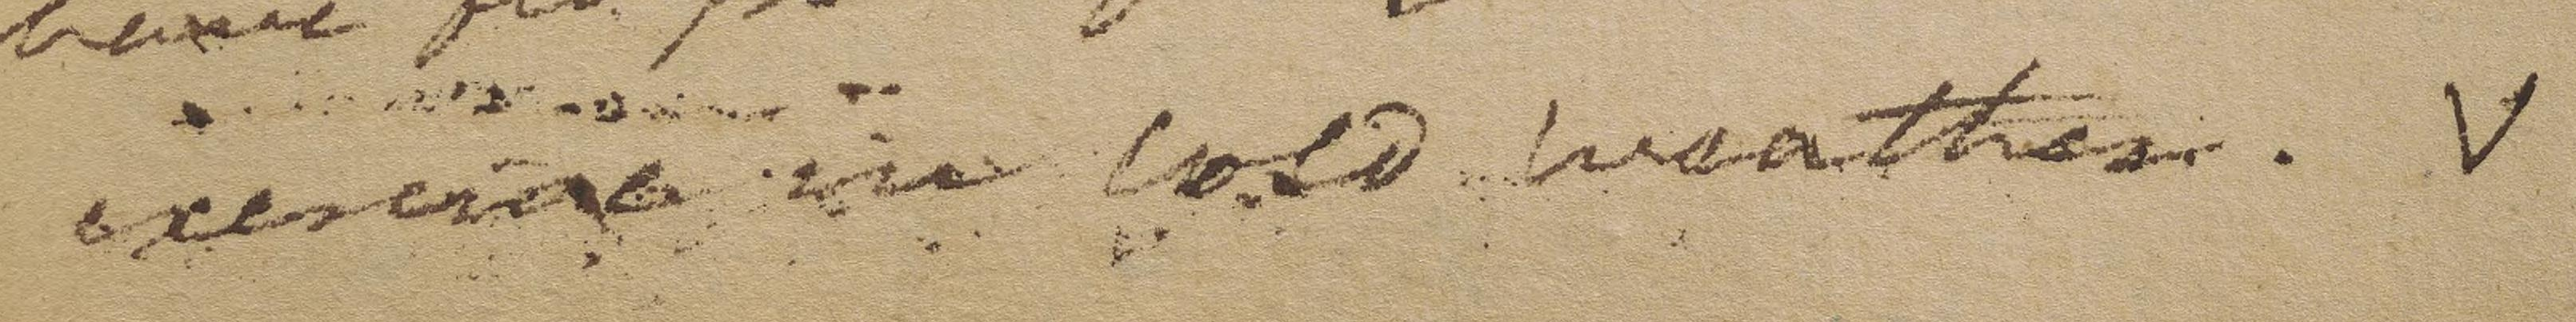exercise in cold weather. V
